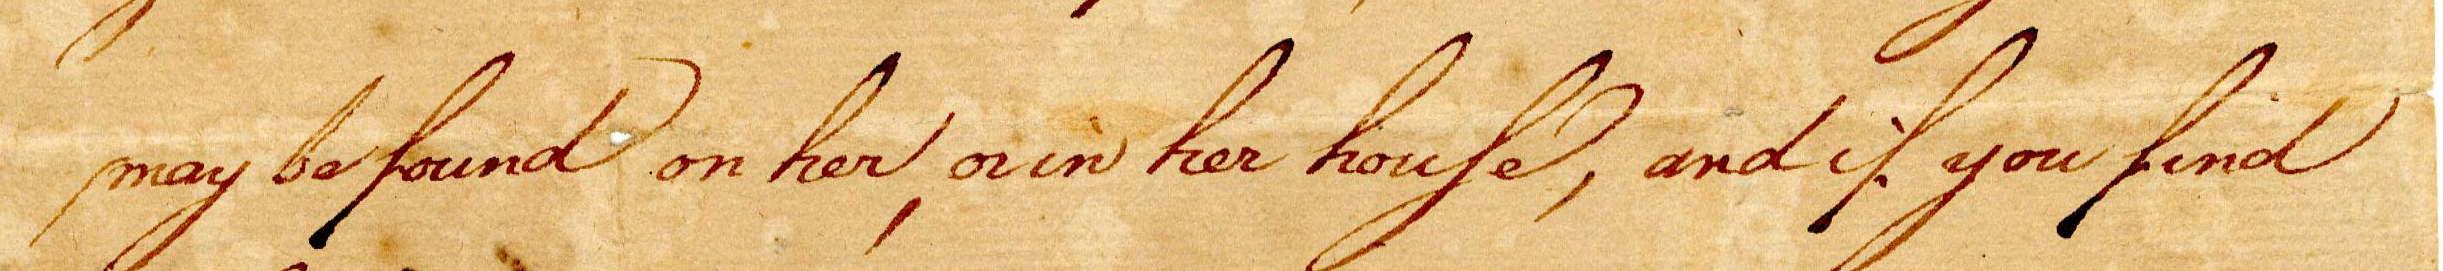may be found on her, or in her house, and if you find
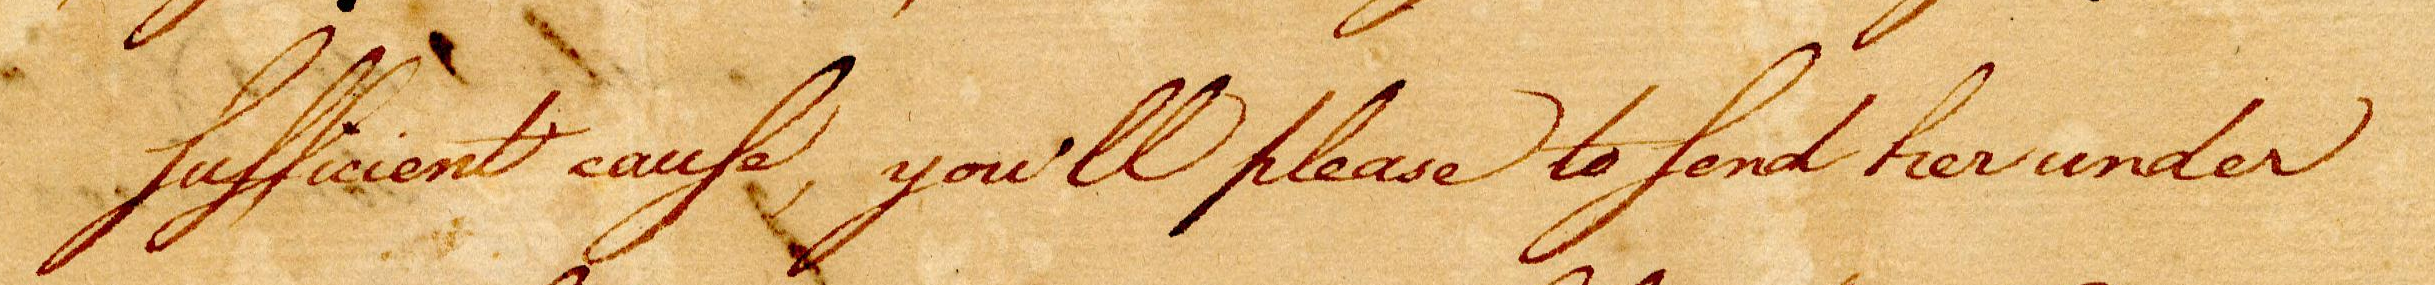sufficient cause, you'll please to send her under
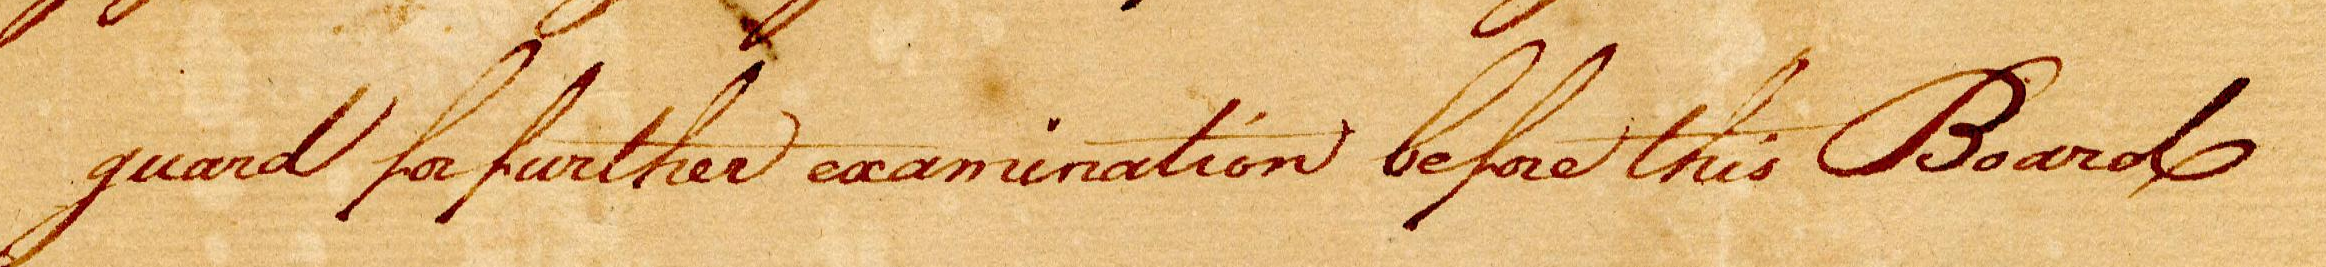guard for further examination before this Board
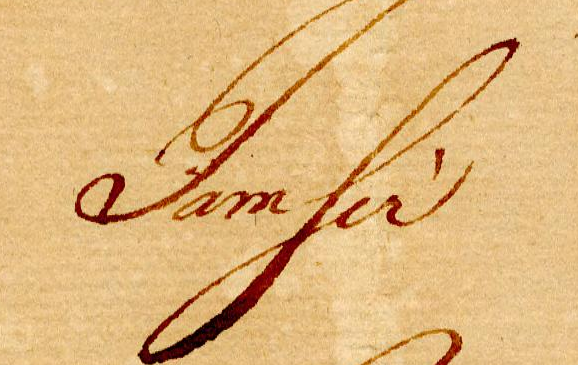I am sir
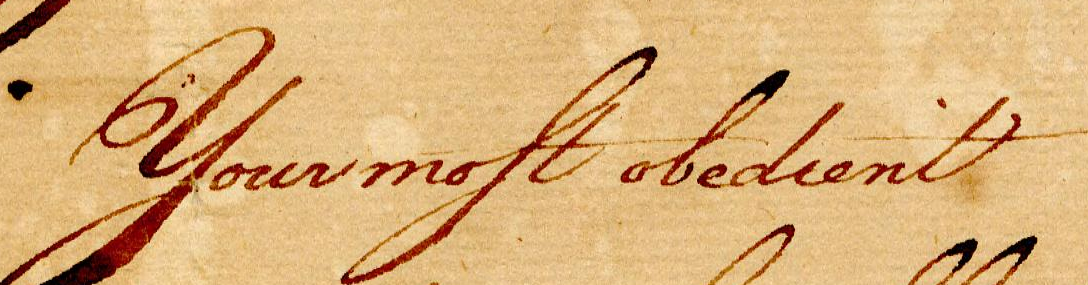Your most obedient
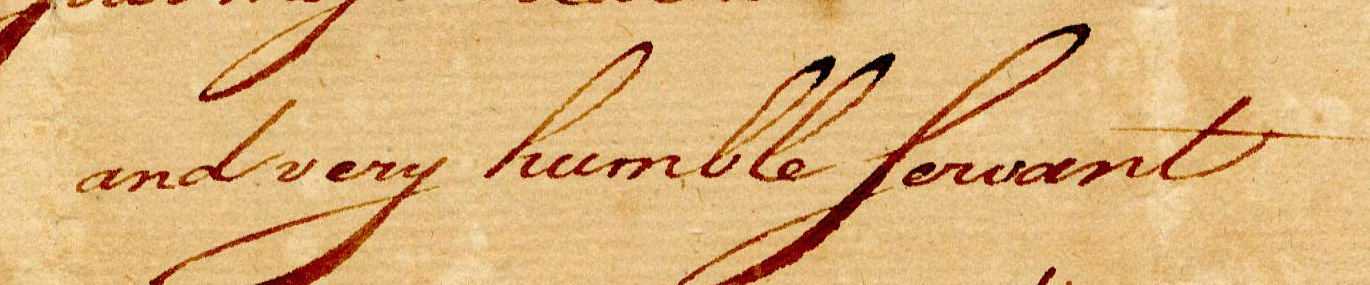and very humble servant
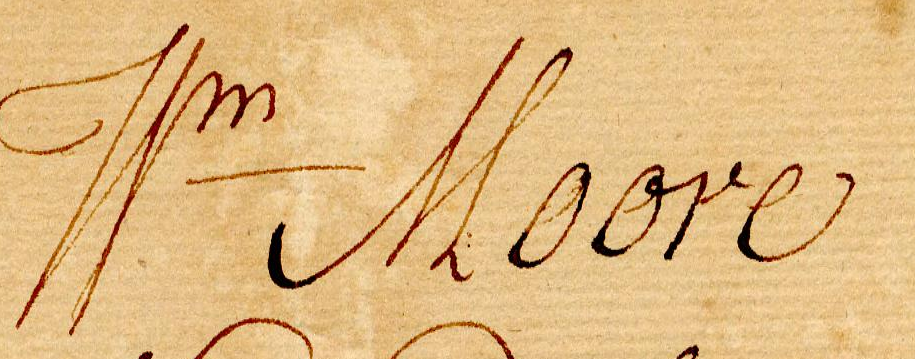W^m Moore
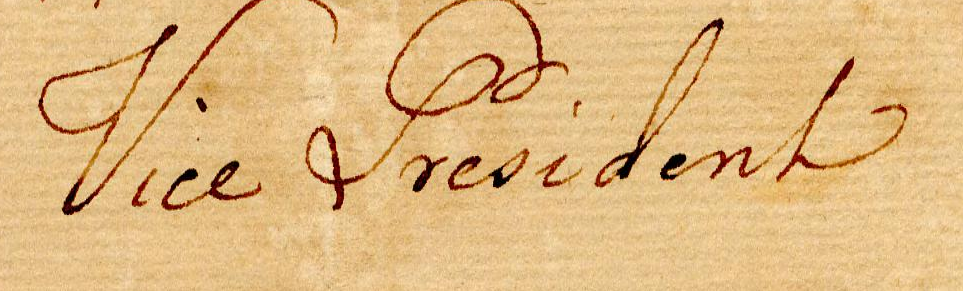Vice President
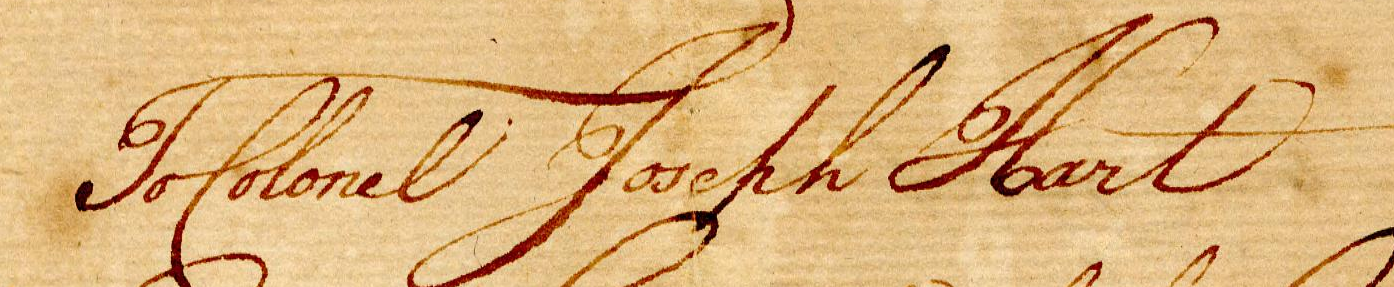To Colonel Joseph Hart
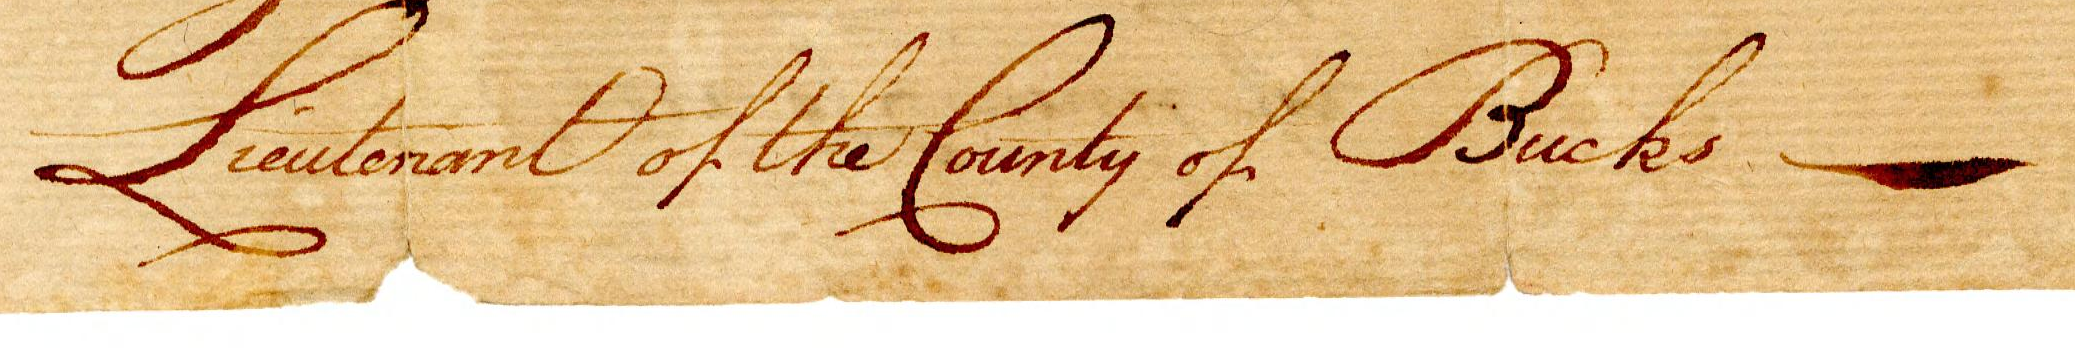Lieutenant of the County of Bucks-
